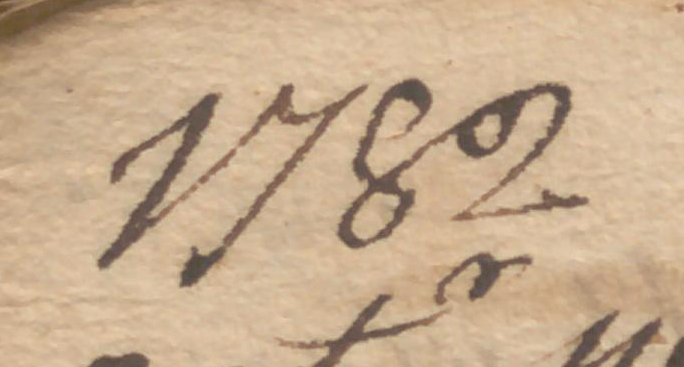1782
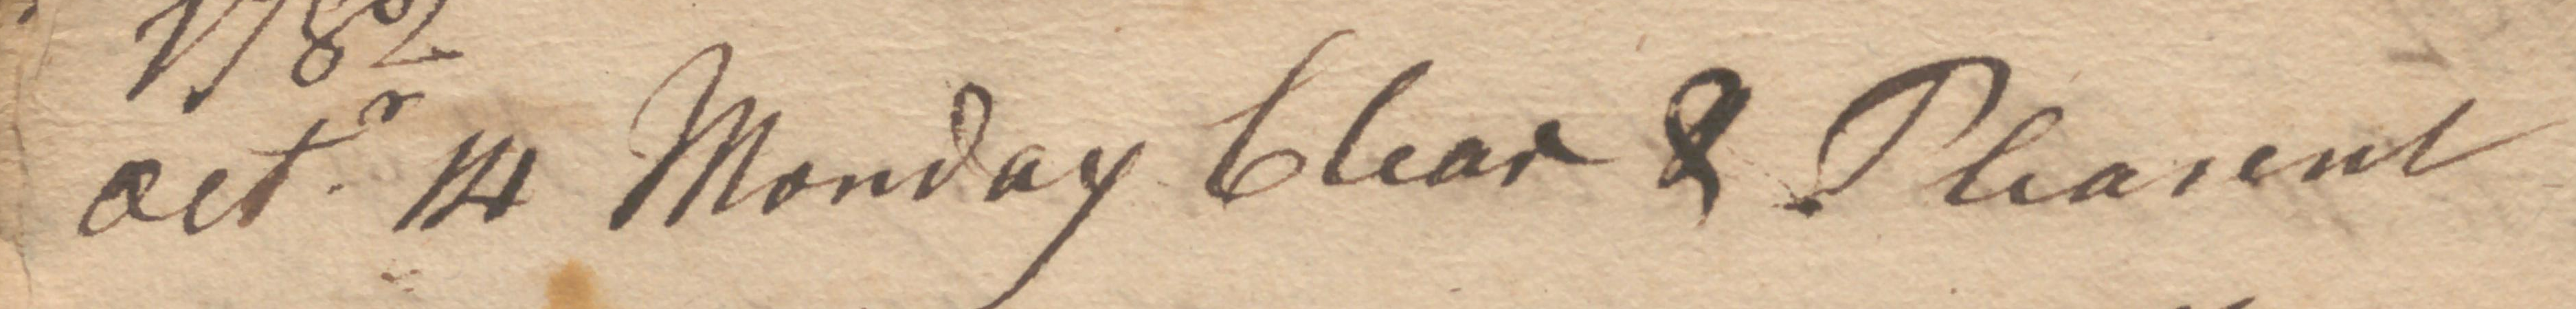oct^r. 14 Monday Clear & Pleasent
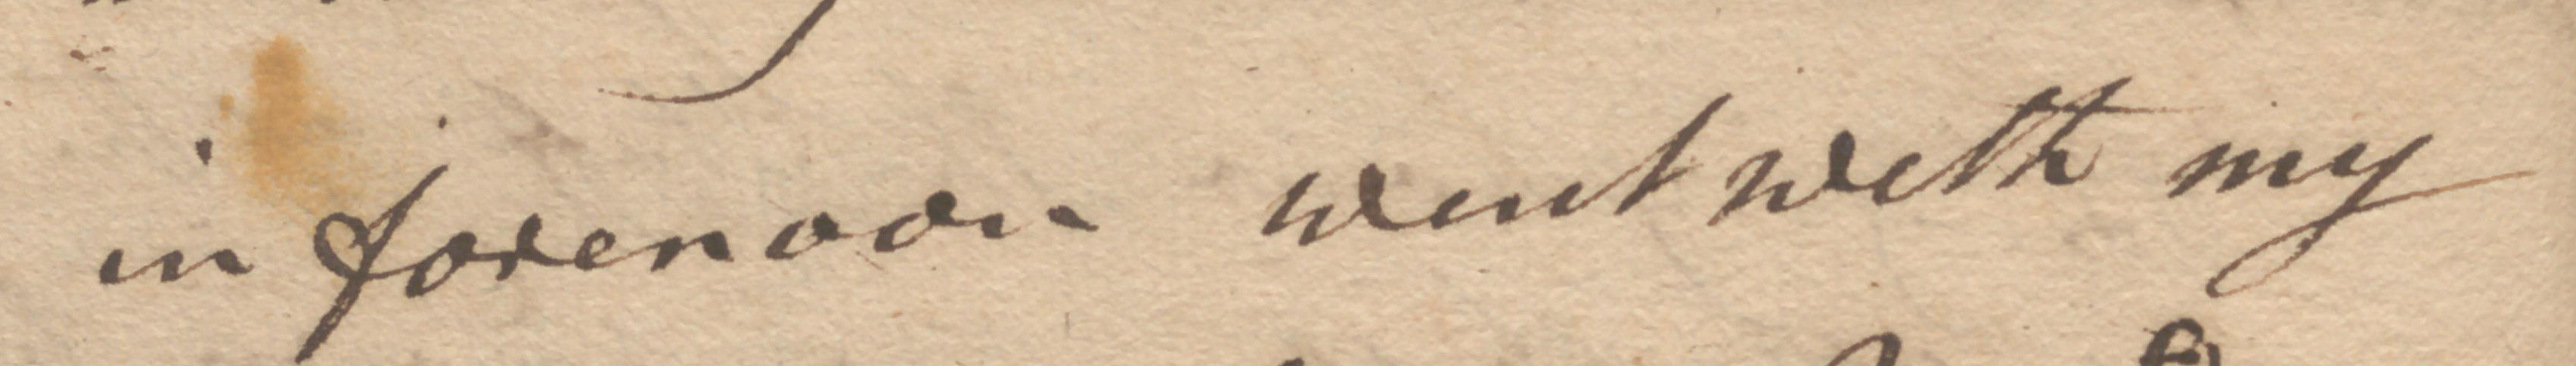in forenoon went with my
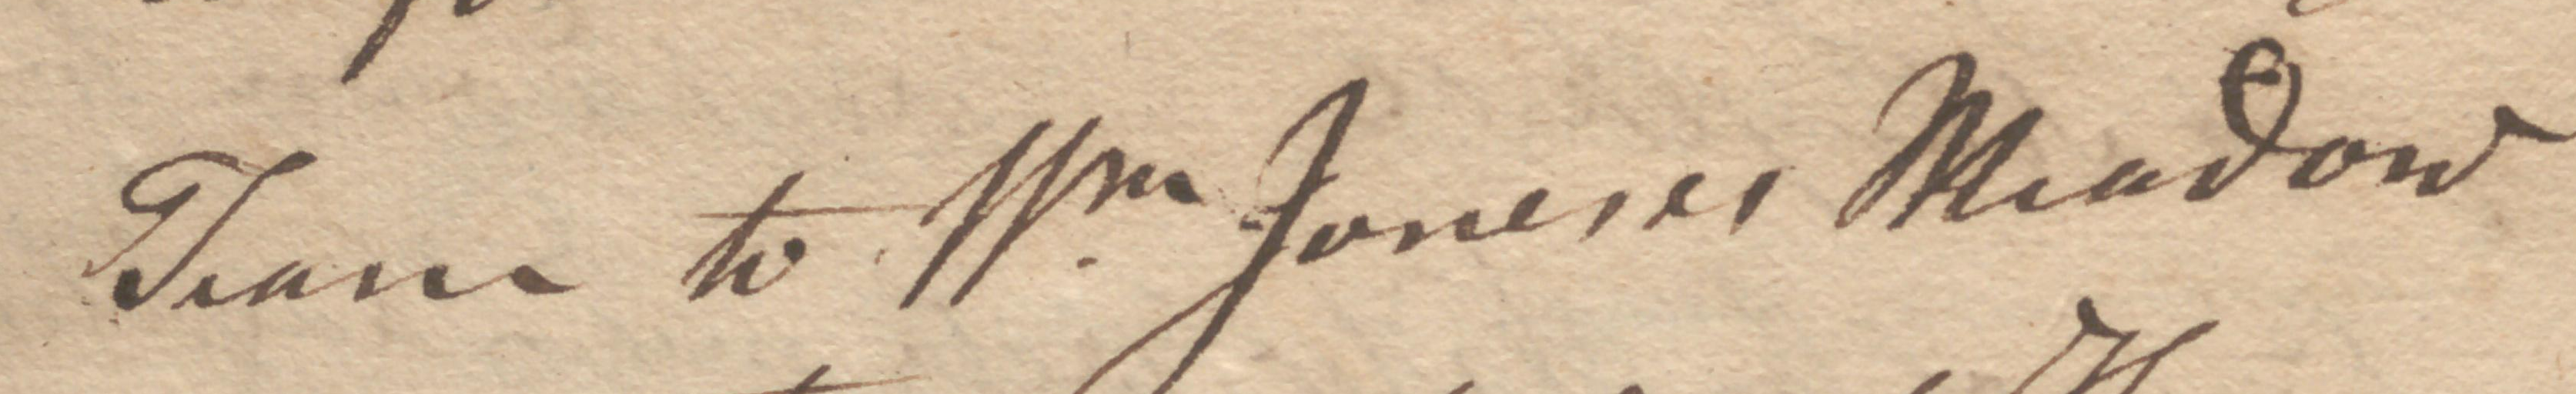Team to W^m. Joneses Meadow
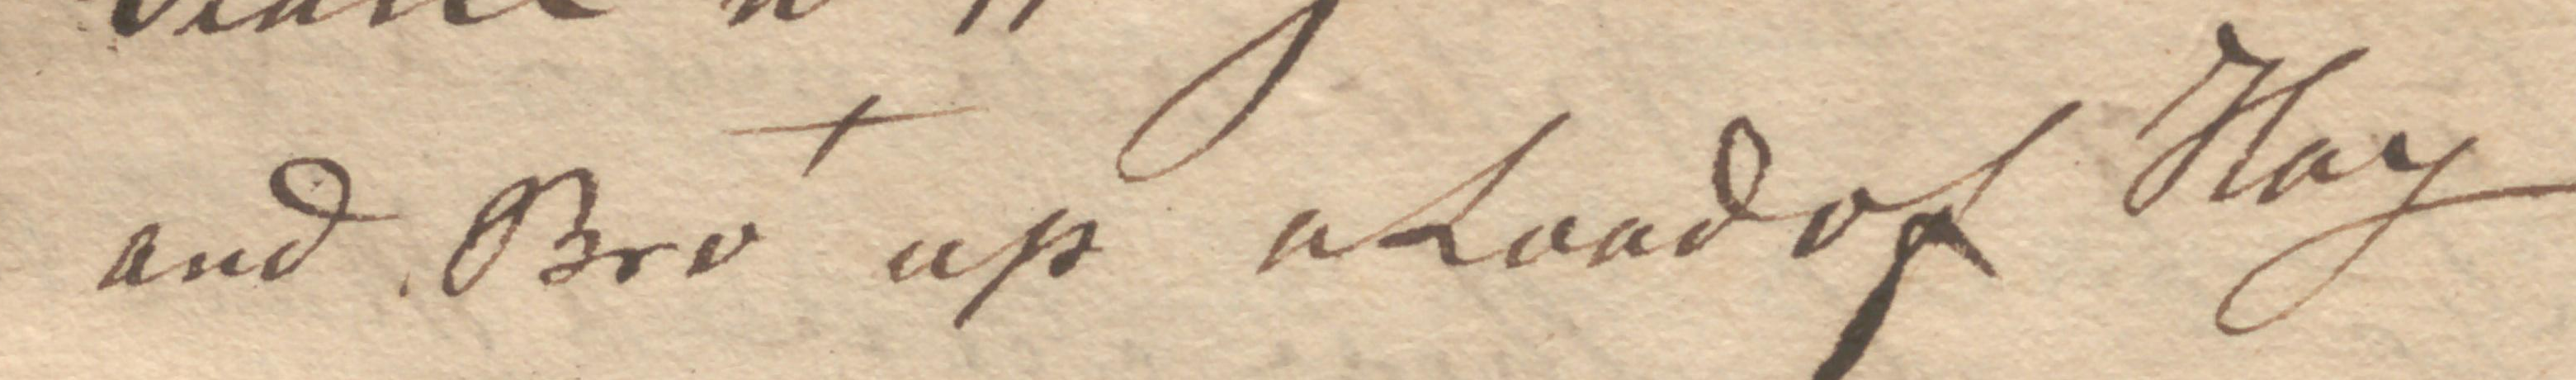and Bro^t up a Load of Hay
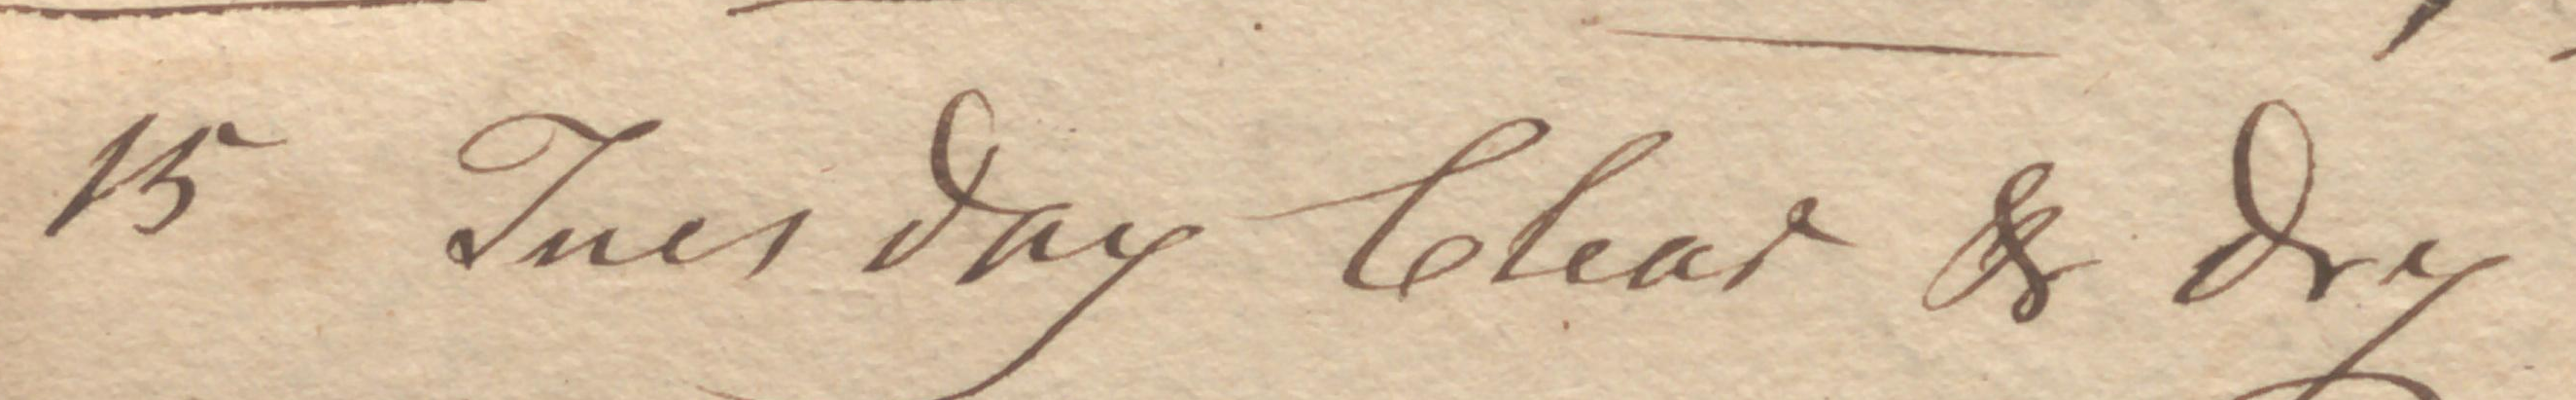15 Tuesday Clear & dry
